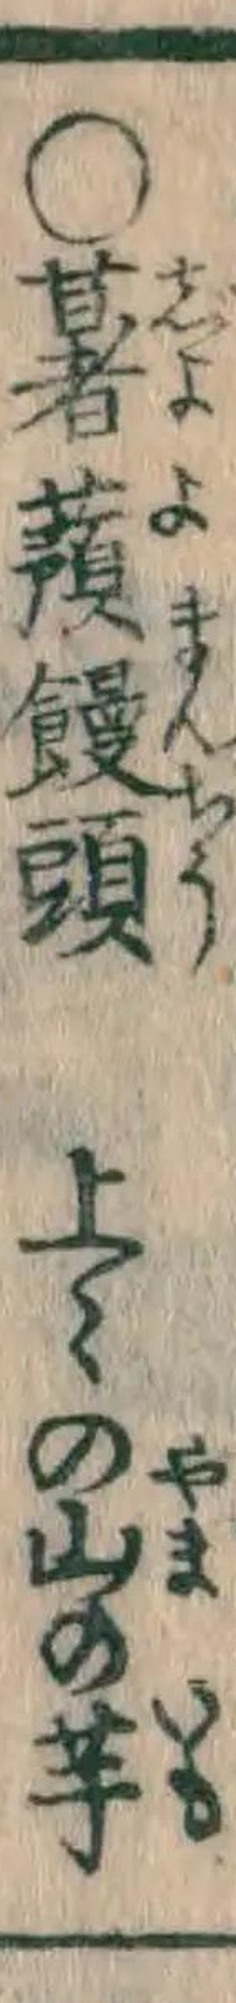○薯蕷饅頭上々の山の芋
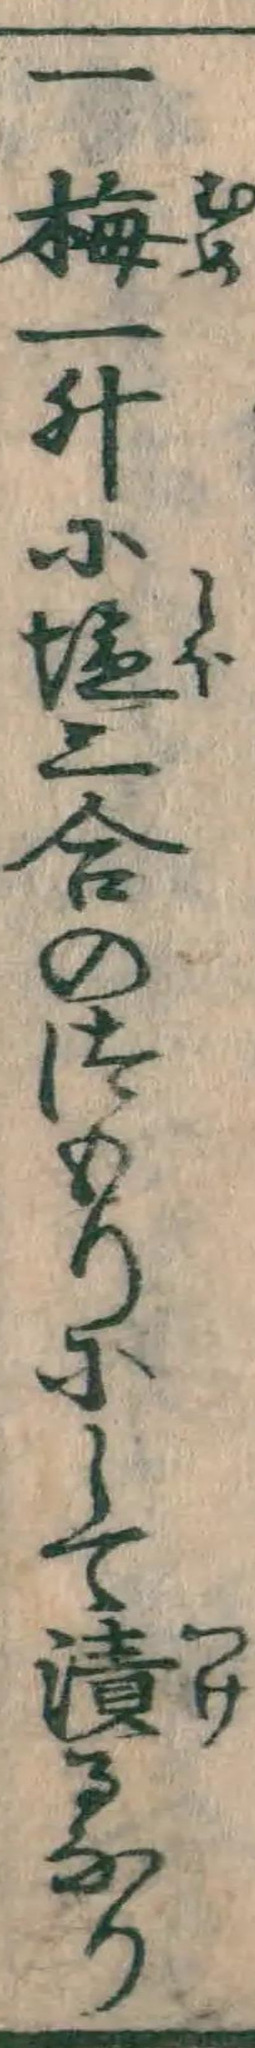一梅一升に塩三合のつもりにして漬るなり

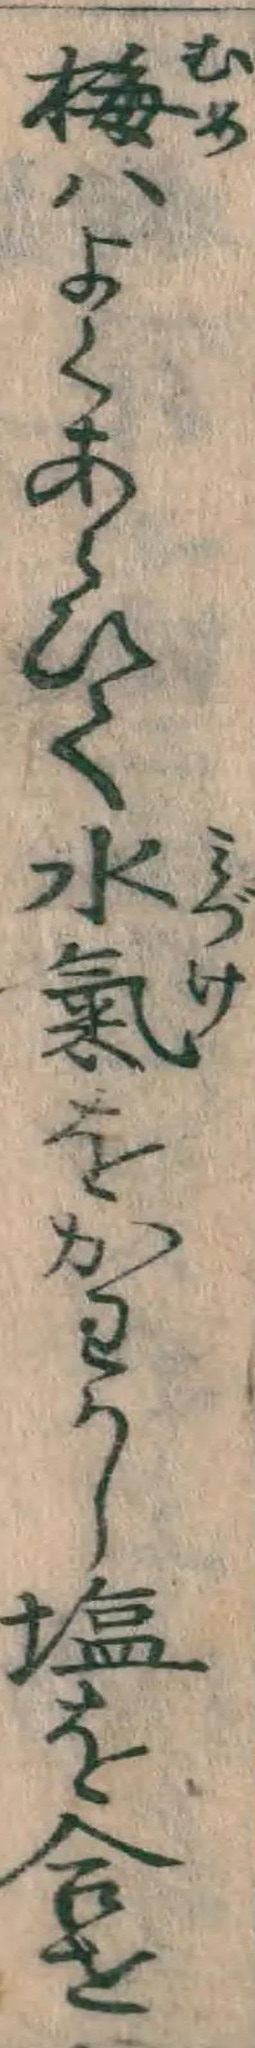梅はよくあらひて水気をかわかし塩を合せ
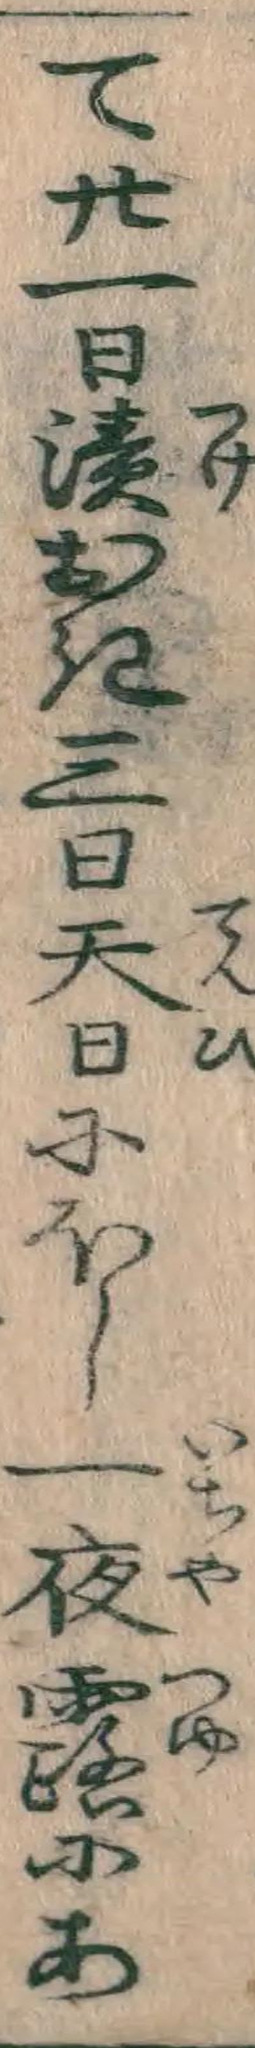て廿一日漬おき三日天日にほし一夜露にあ
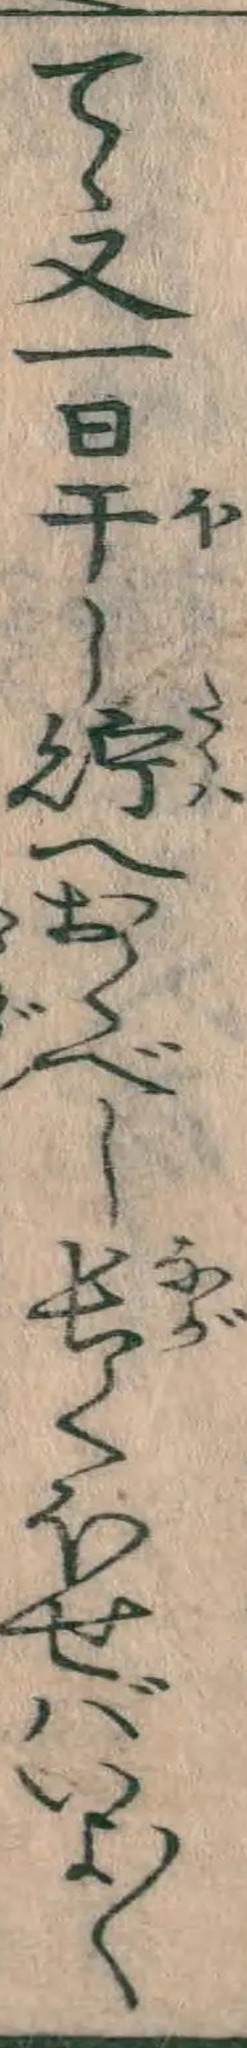てゝ又一日干し貯へおくべし長くほせばいよ〳〵
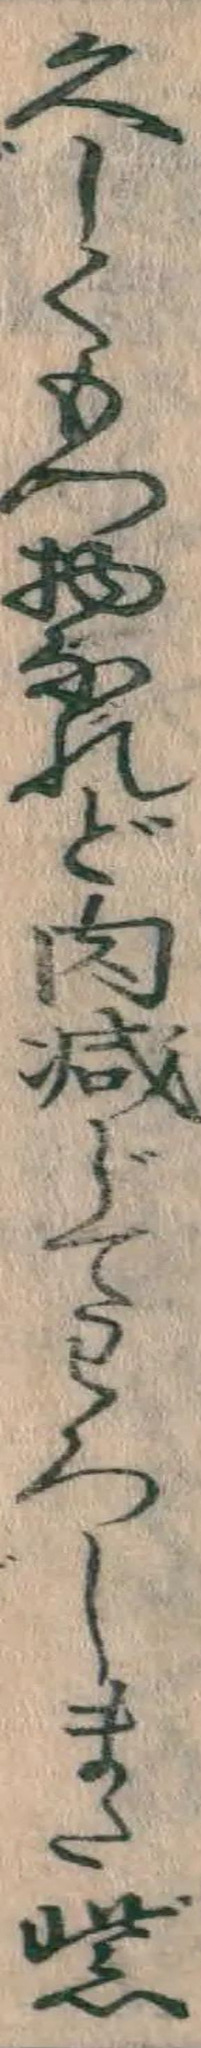久しくもつ物なれど肉減じてわろしまた紫
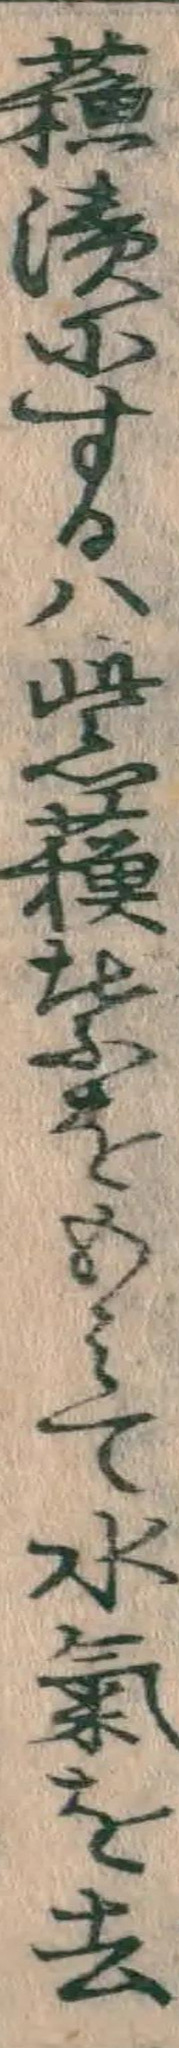蘓漬にするは紫蘓葉をもみて水気を去
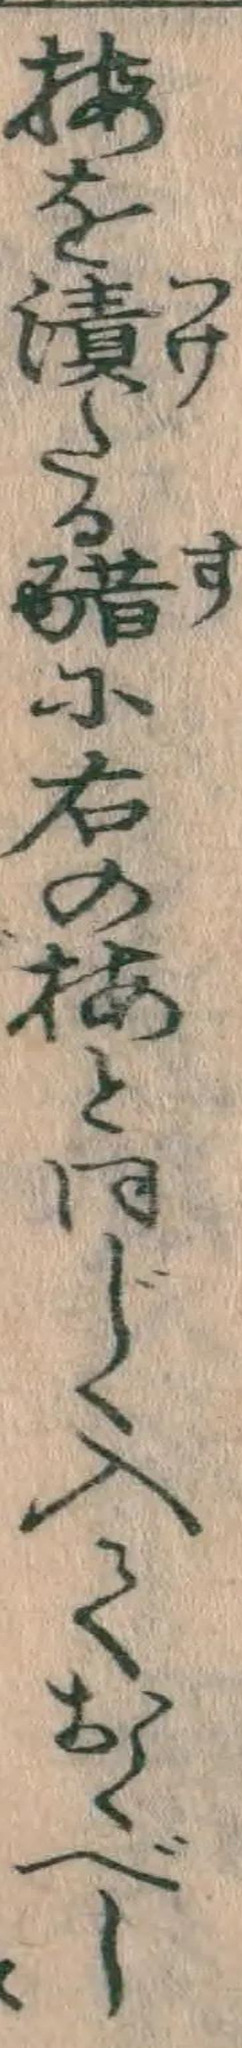梅を漬たる醋に右の梅と同じく入ておくべし
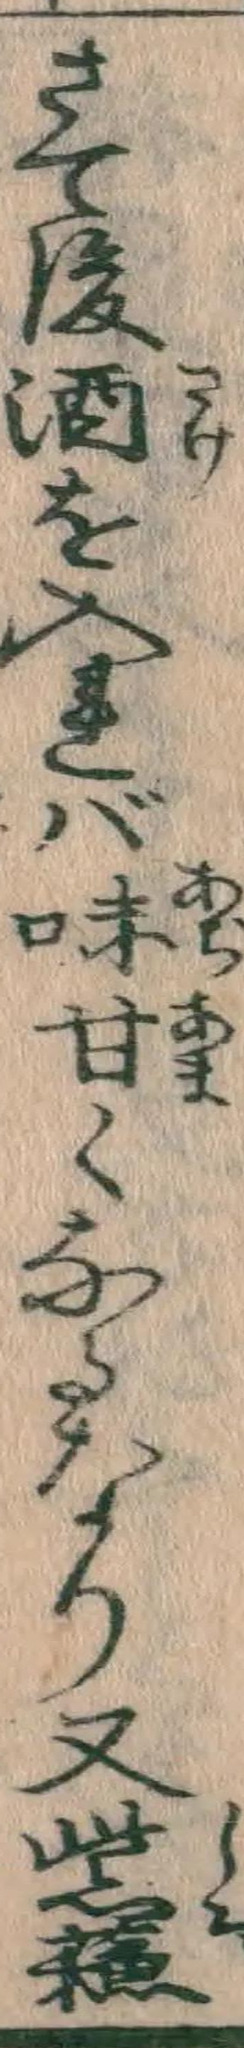さて後酒を入れば味甘くなるなり又紫蘓
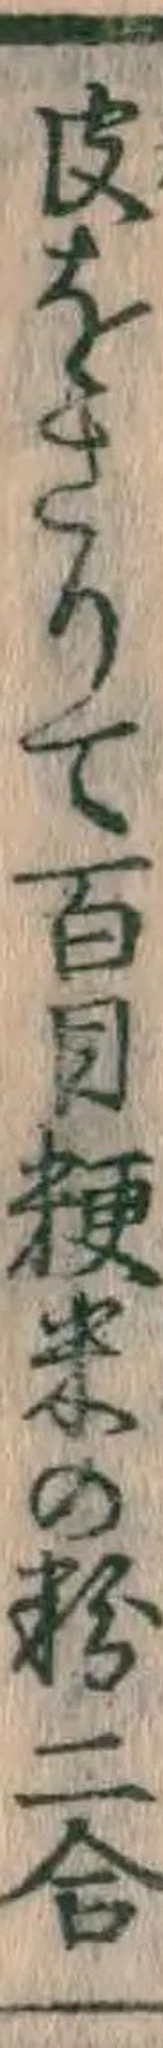皮をさりて百目粳米の粉二合
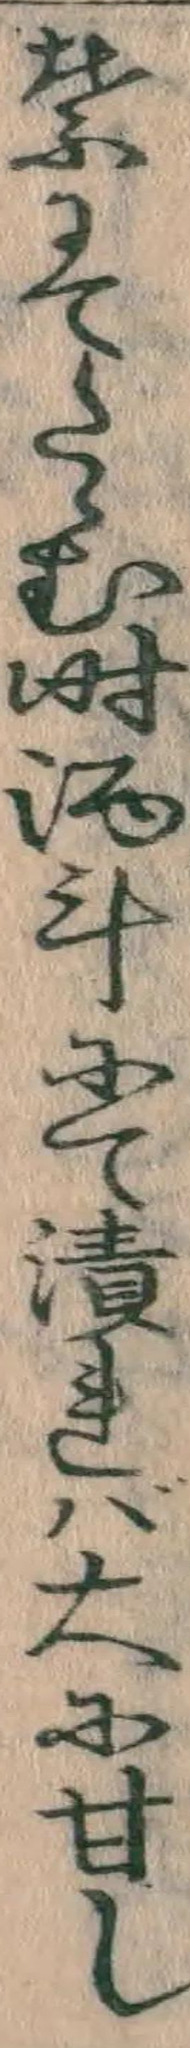葉にてたゝむ時酒斗にて漬れば大に甘し
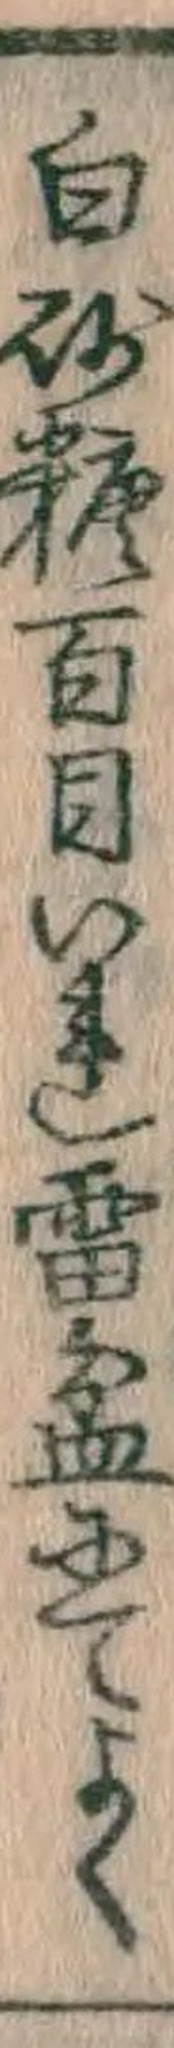白砂糖百目いれ雷盆にてよく
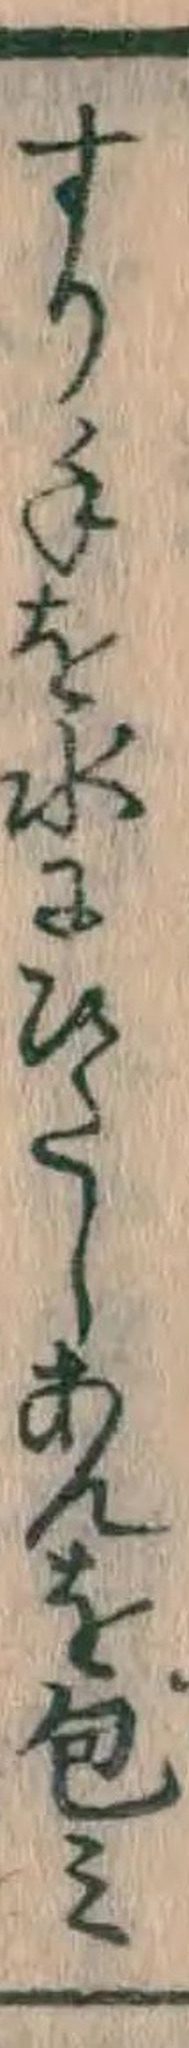すり手を水にひたしあんを包み
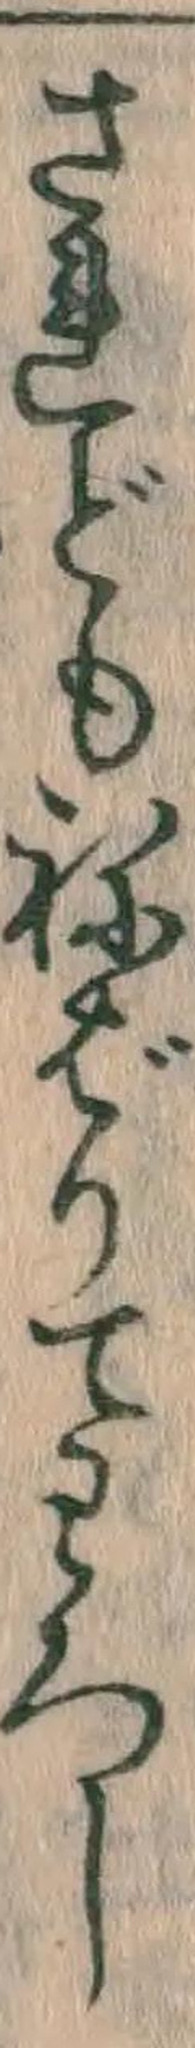されどもねばりてわろし
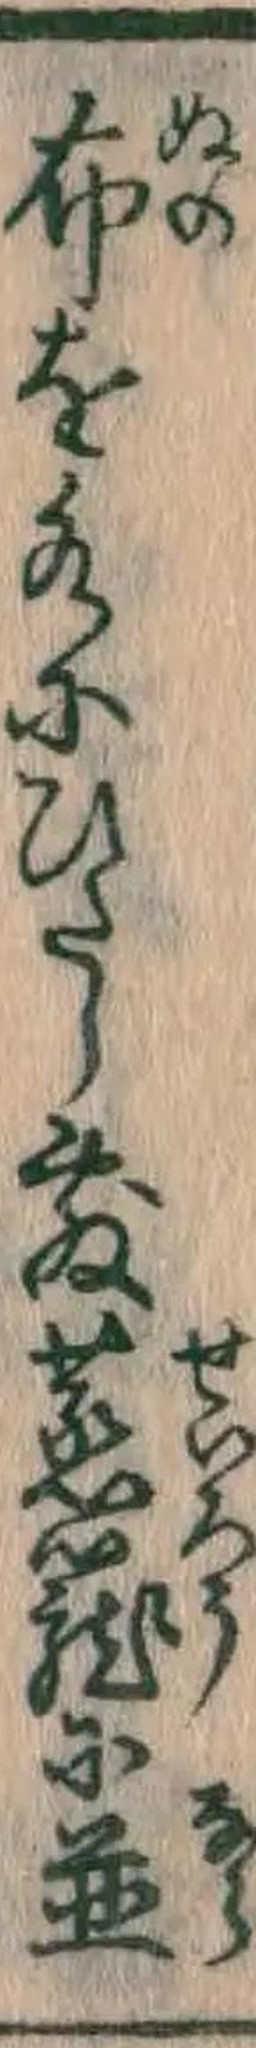布を水にひたし敷蒸籠に並
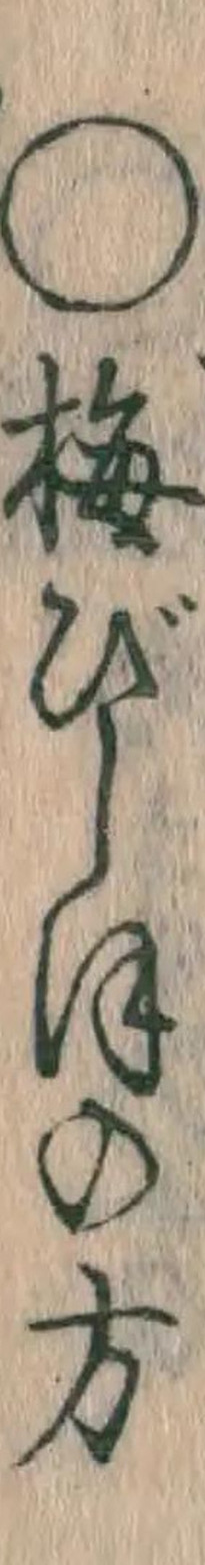○梅びしほの方
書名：広益秘事大全 3巻. [5]
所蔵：国立国会図書館 National Diet Library, JAPAN
